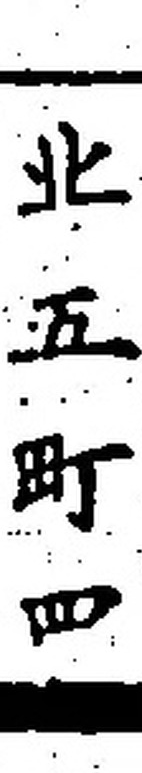北五町四
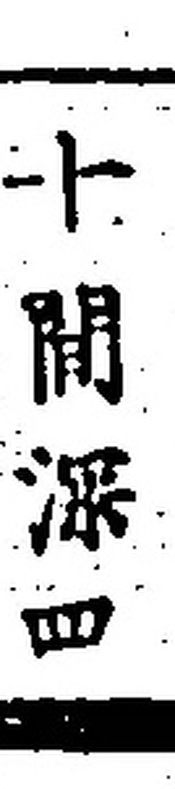十間深四
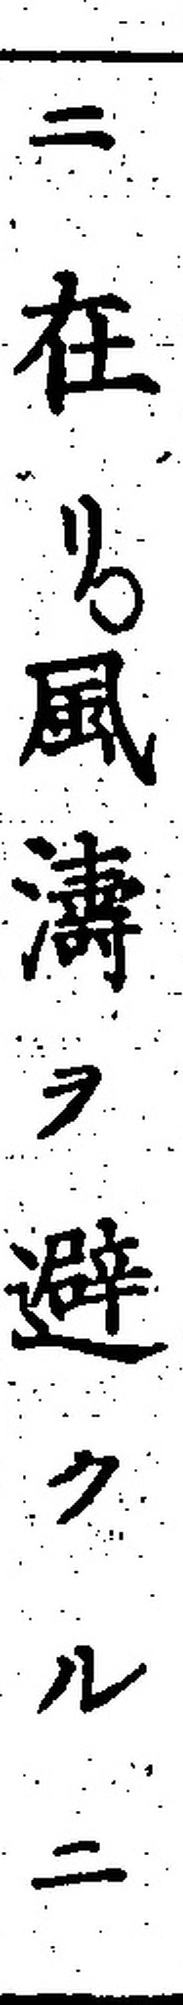ニ在リ。風濤ヲ避クルニ
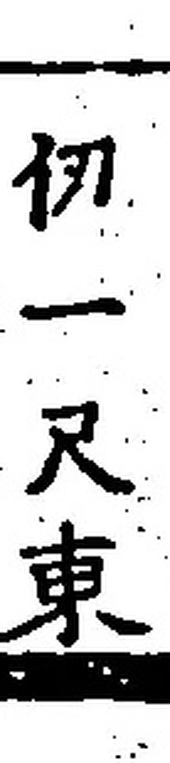仞一尺東
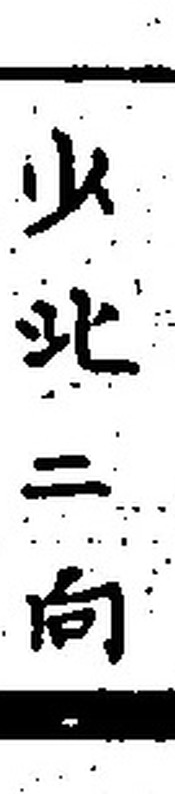少北ニ向
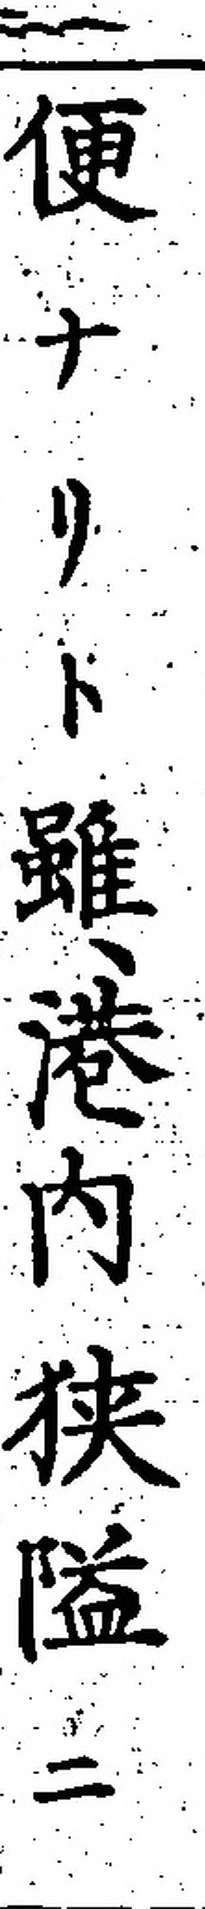便ナリト雖、港内狭隘ニ
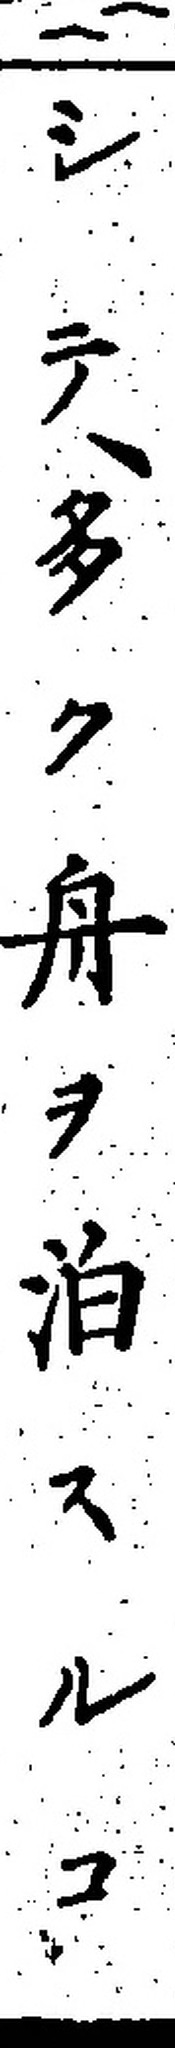シテ、多ク舟ヲ泊スルコ
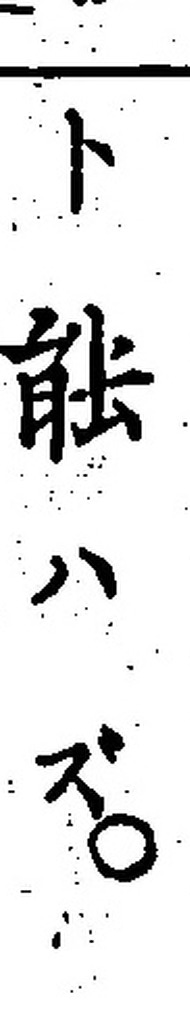ト能ハズ。
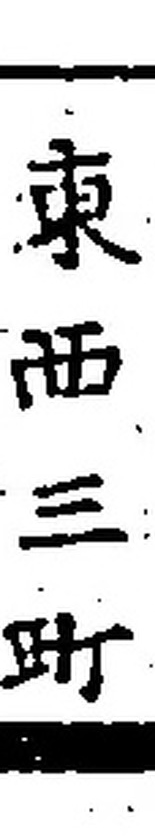東西三町
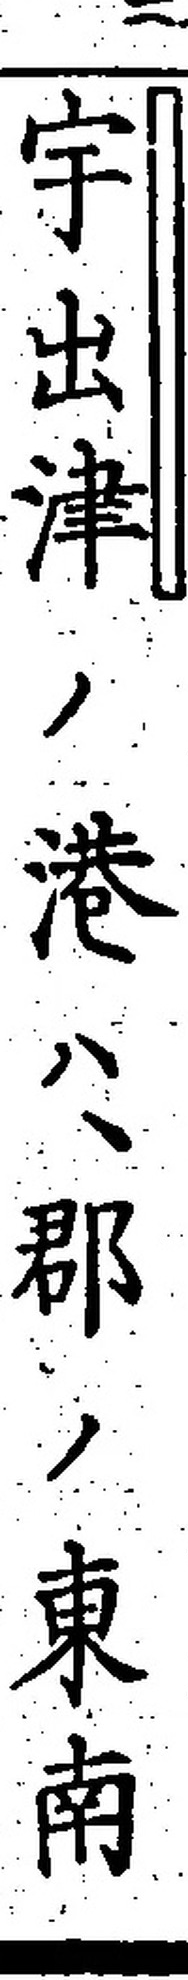宇出津ノ港ハ、郡ノ東南
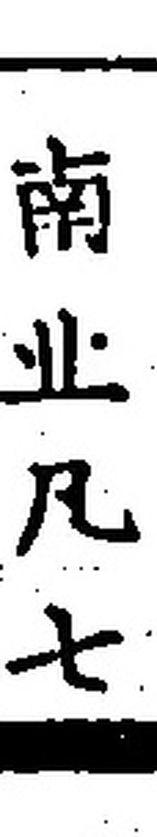南北凡七
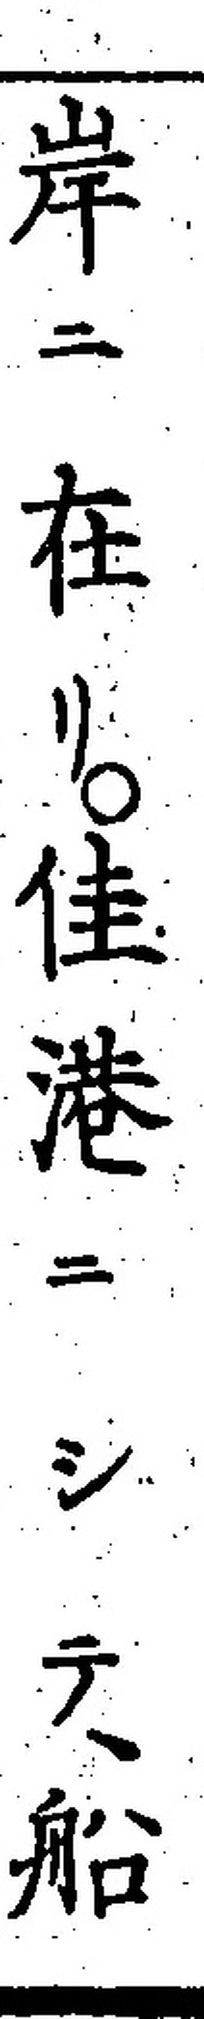岸ニ在リ。佳港ニシテ、船
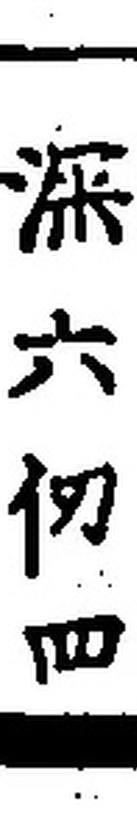深六仞四
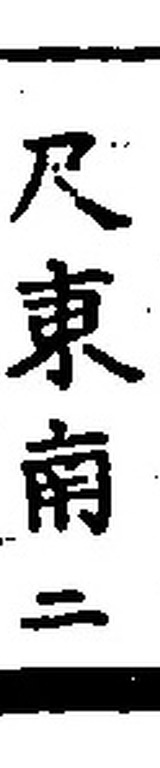尺東南ニ
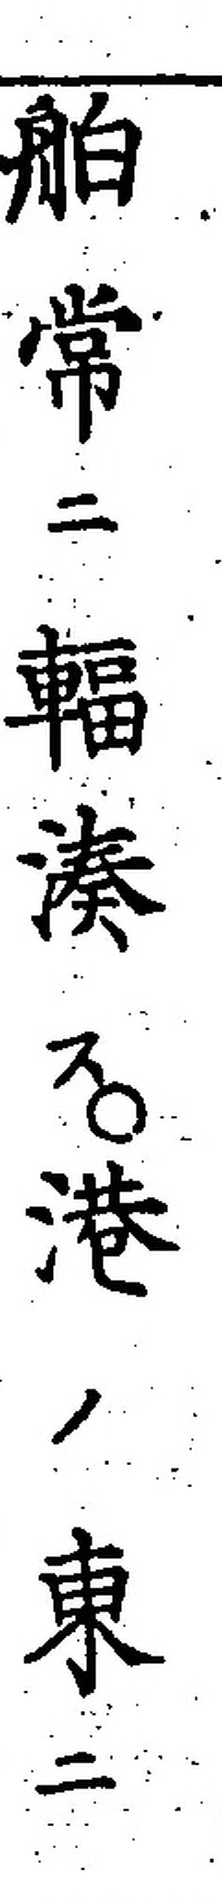舶常ニ輻湊ス。港ノ東ニ
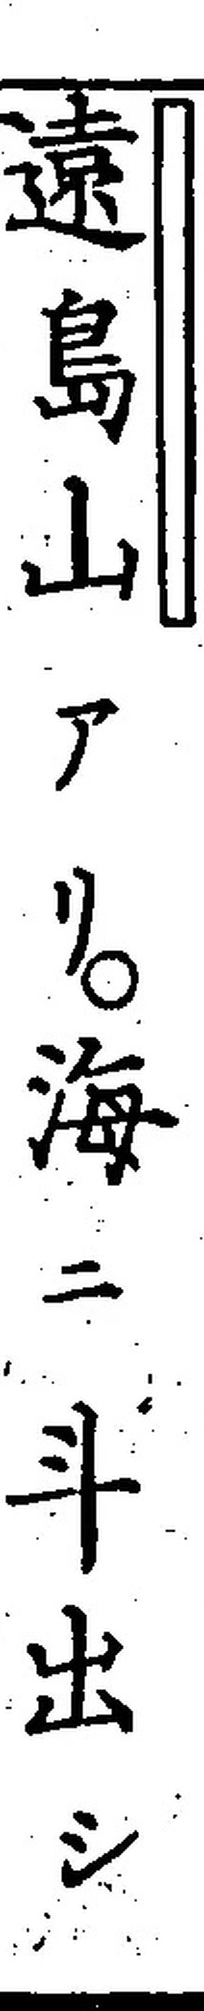遠島山アリ。海ニ斗出シ
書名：能登地誌略
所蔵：国立国会図書館 National Diet Library, JAPAN
